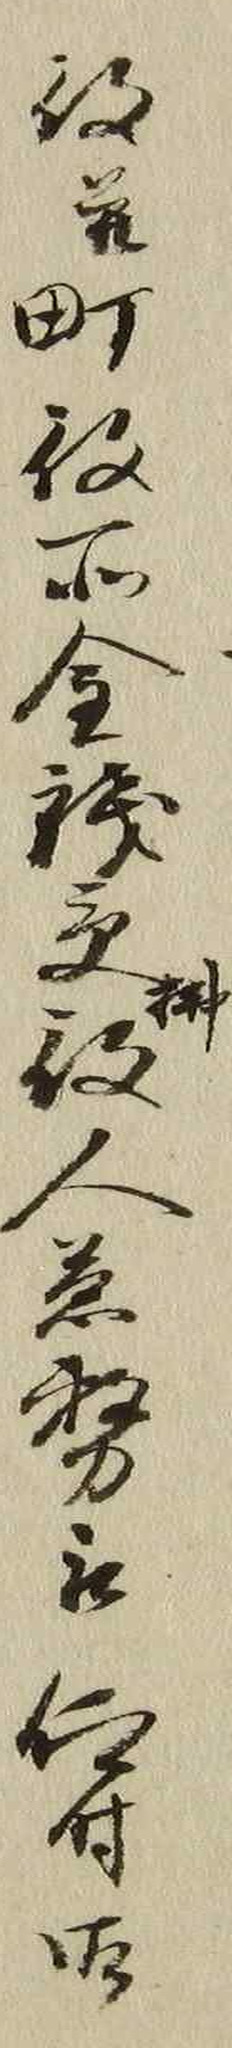役并町役所金銭受払役人兼務被仰付御
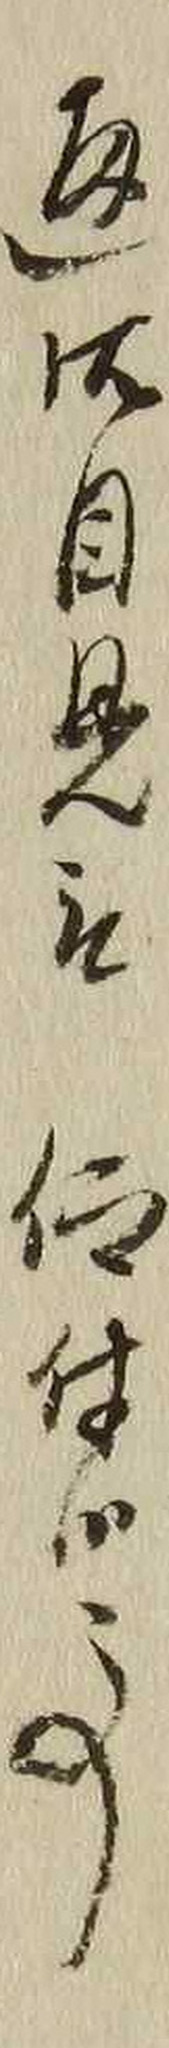通御目見被仰付候事
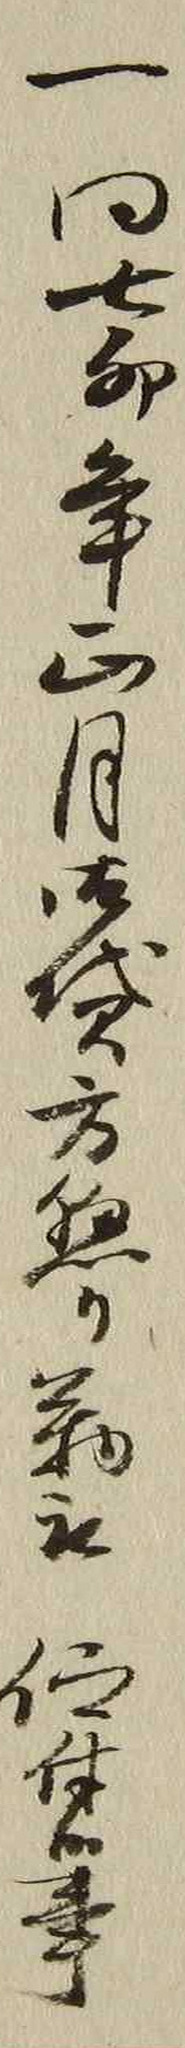一同七卯年正月御貸方懸り勤被仰付候事
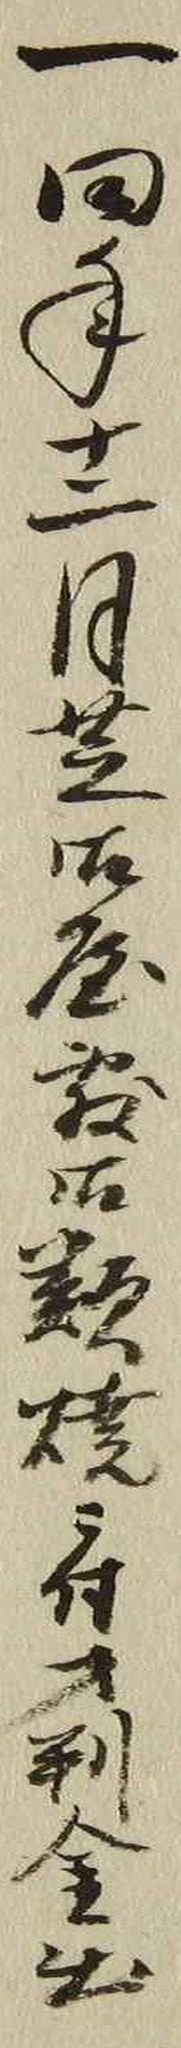一同年十二月芝御屋敷御類焼ニ付才判金出
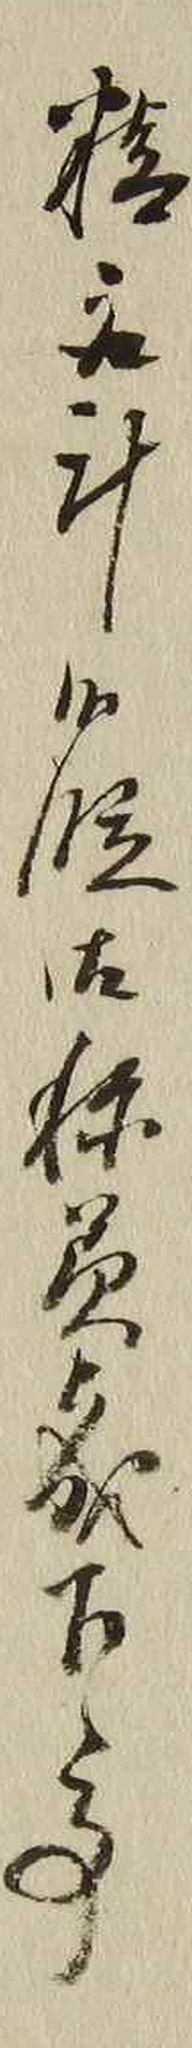精取計候段御称美被成下候事
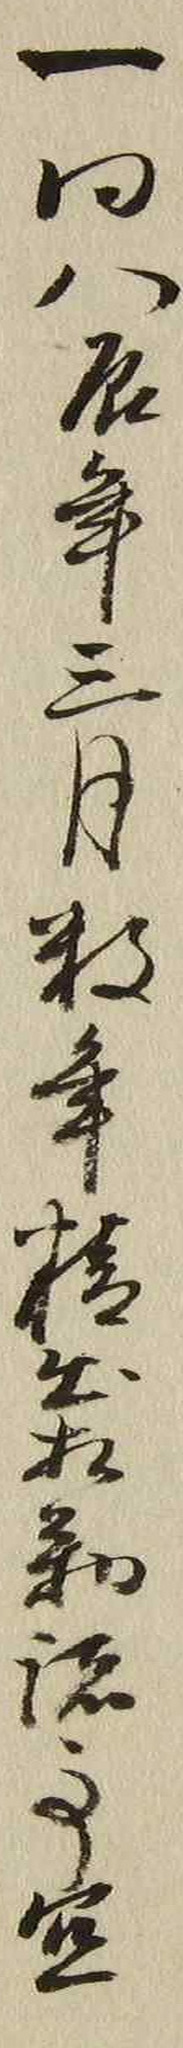一同八辰年三月数年精出相勤諸事宜
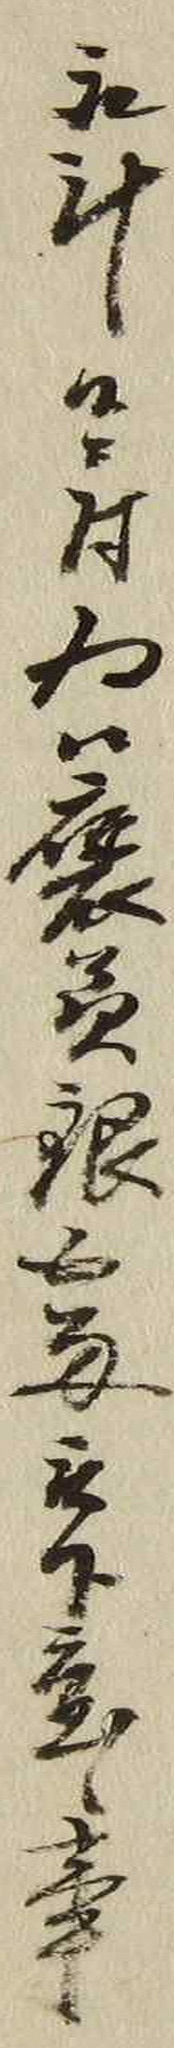取計候ニ付為御褒美銀五両被下置候事
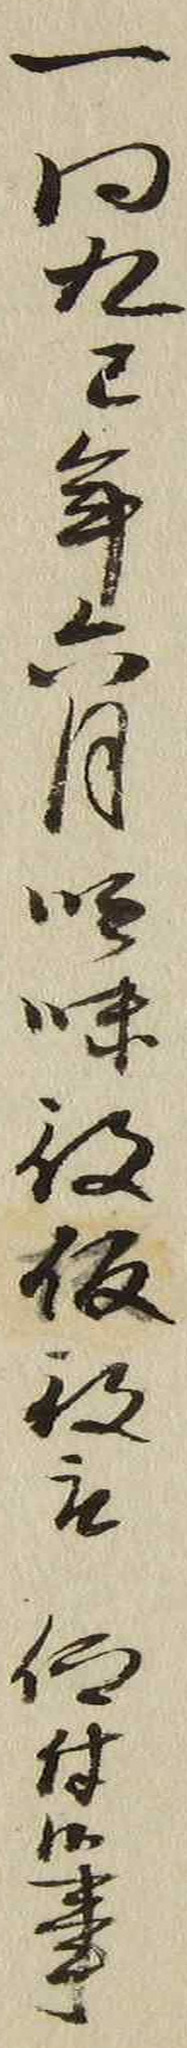一同九巳年六月吟味役仮役被仰付候事
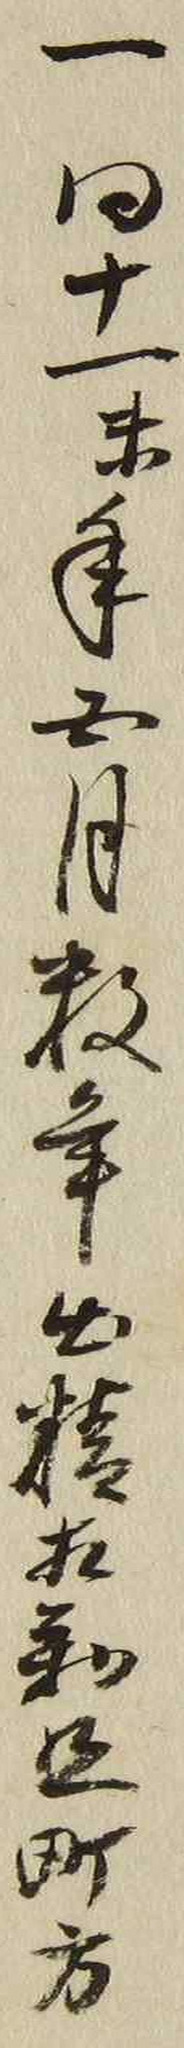一同十一未年五月数年出精相勤且町方
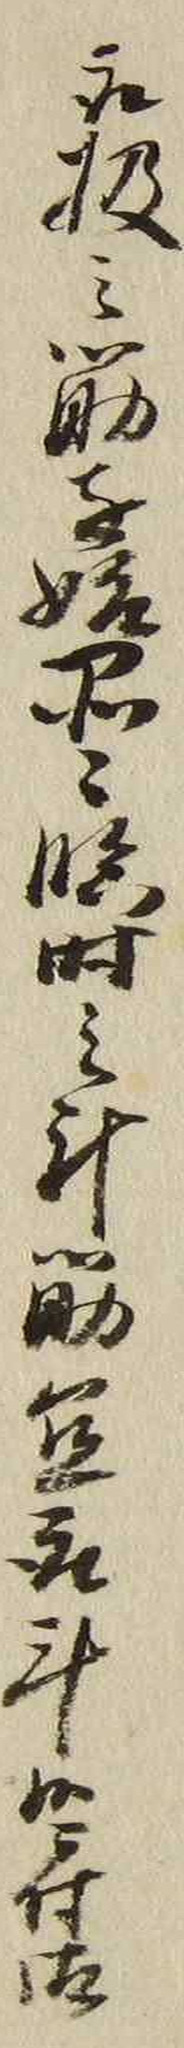取扱之筋を始品々臨時之計筋宜取計候ニ付御
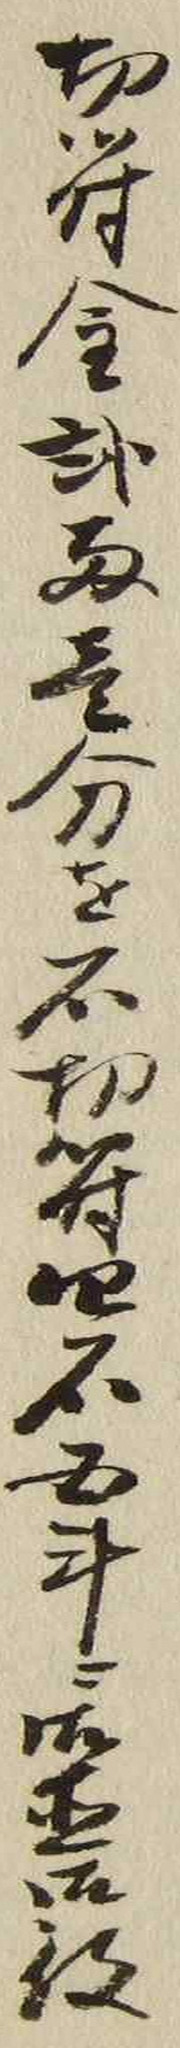切符金弐両壱分を石切符四石五斗ニ御直御役
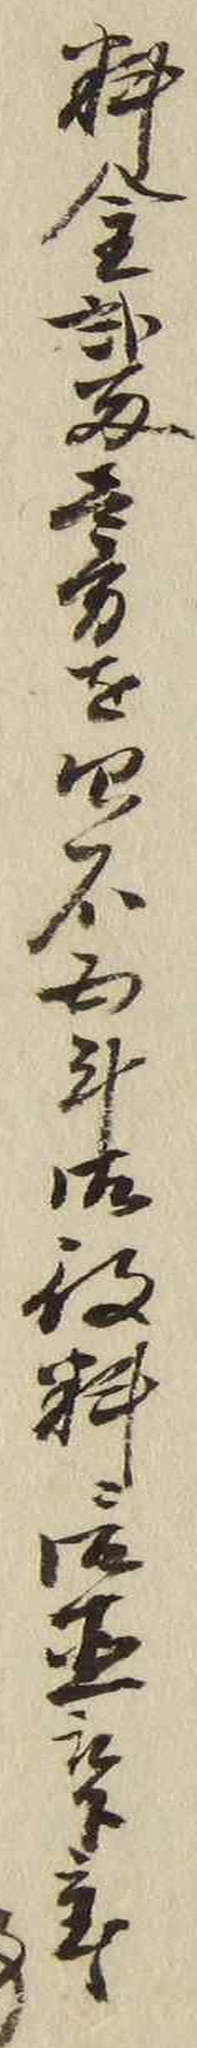料金弐両壱分を四石五斗御役料ニ御直被下置候事

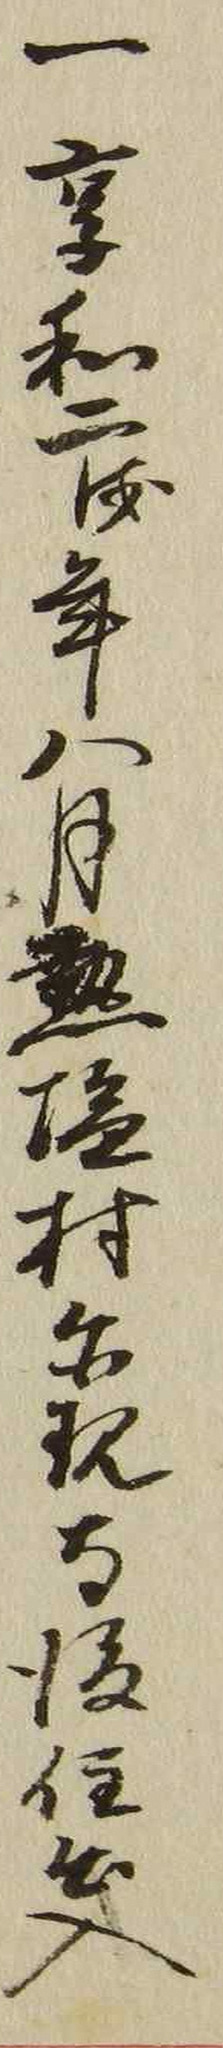一享和二戌年八月熱塩村尓現寺後住出入
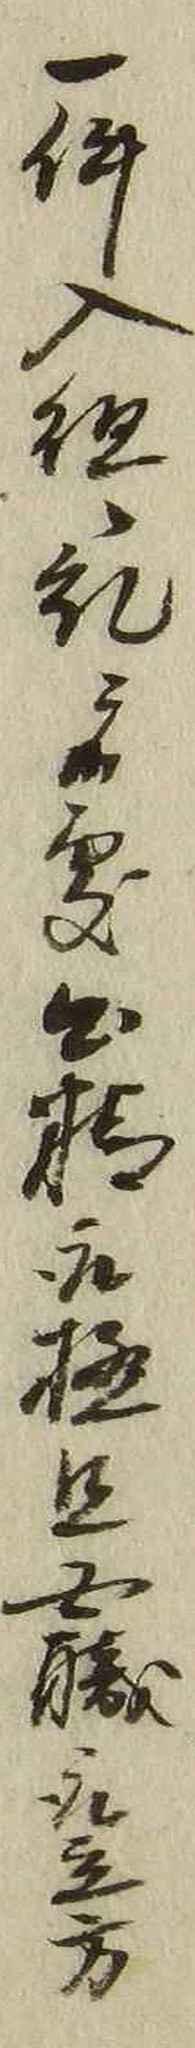一件入組へ糺ニ候処出精取極且五職取立方
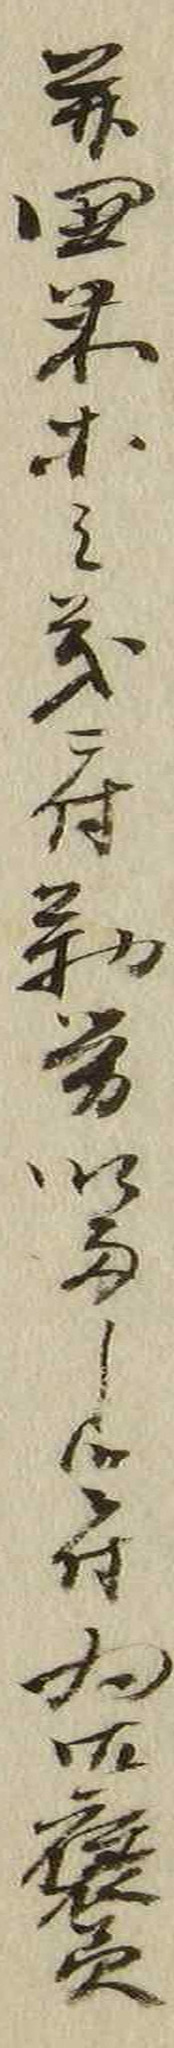并囲米等之義ニ付勤労いたし候ニ付為御褒美
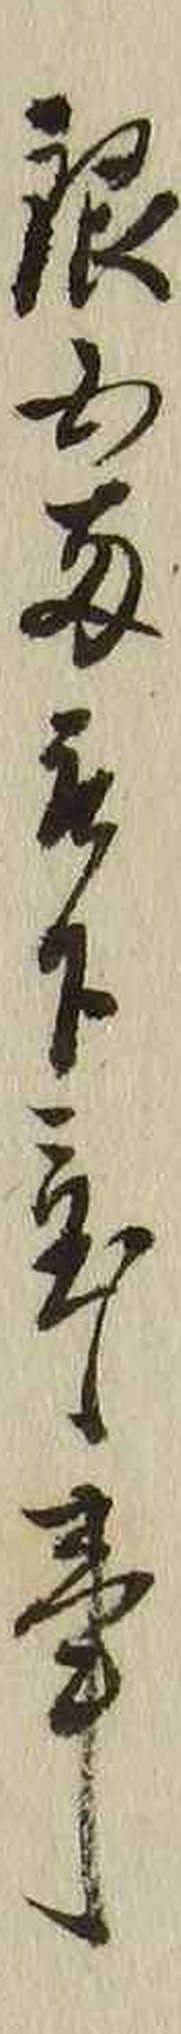銀五両被下置候事
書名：諸士系譜　巻之360　す之部10
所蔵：会津若松市立会津図書館
